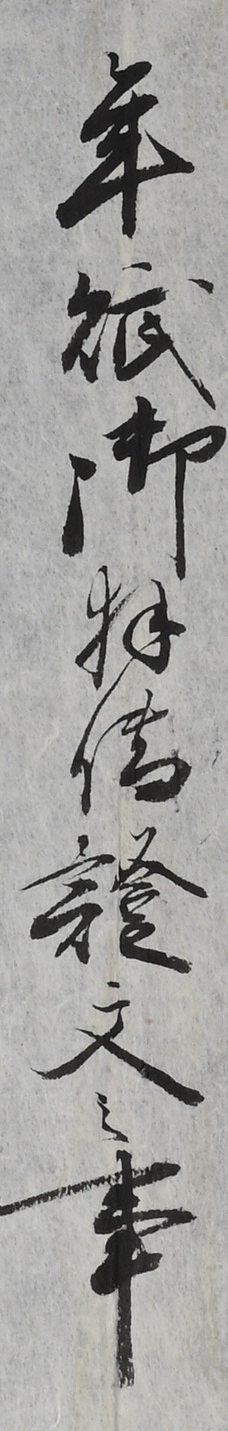年賦御拝借証文之事
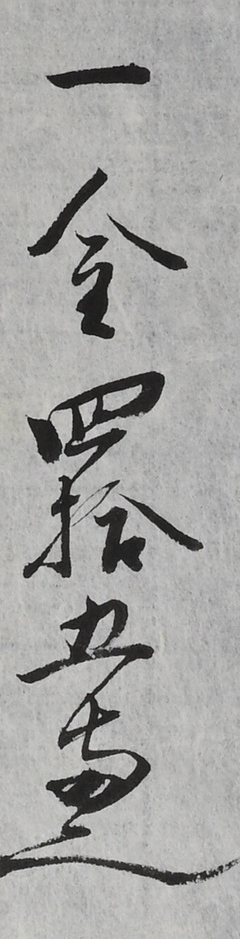一金四拾五両也
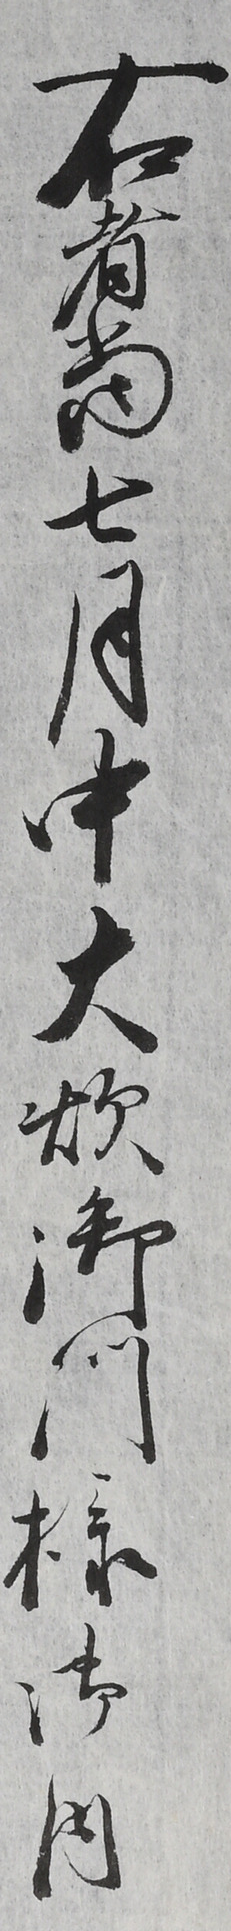右者当七月中大炊御門様御内
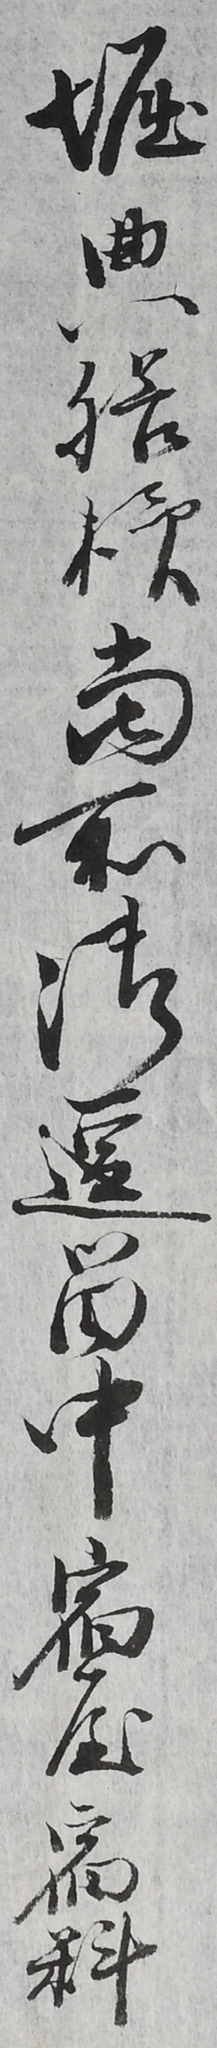堀典膳様当所御逗留中宿屋宿料
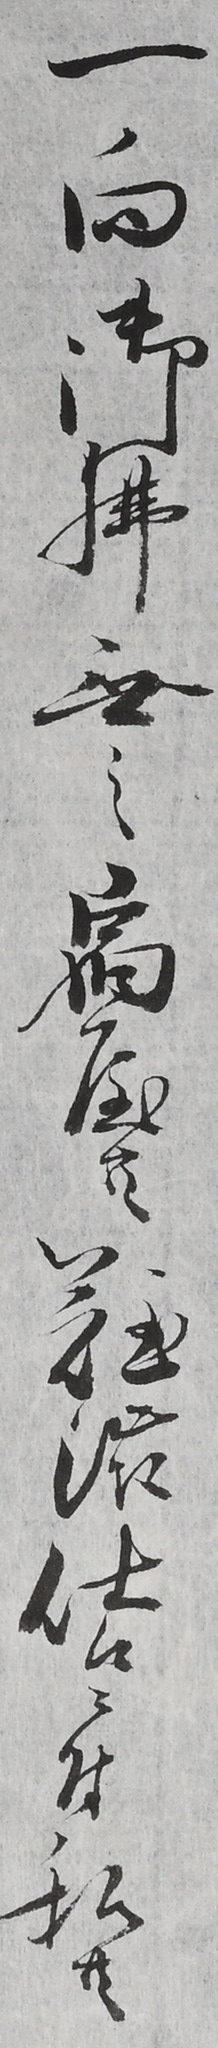一向御払無之宿屋共難渋仕候ニ付私共
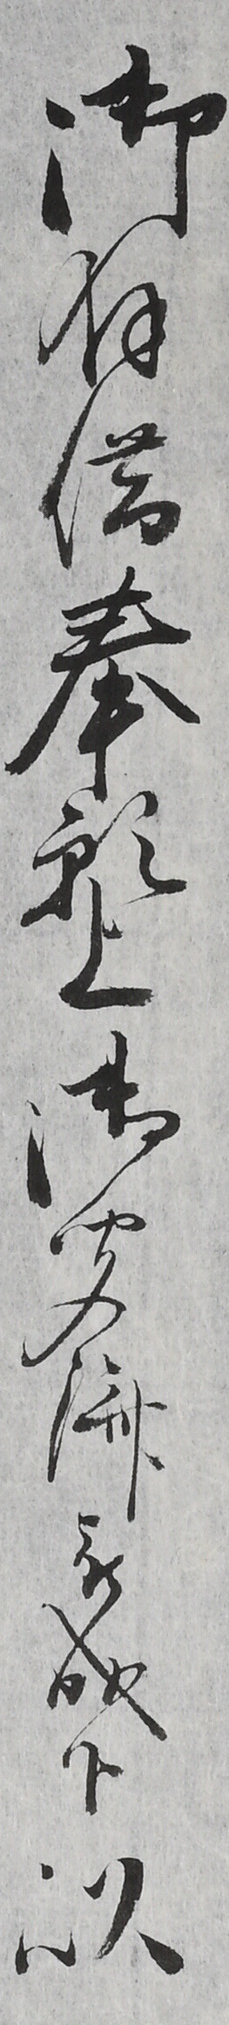御拝借奉願上御聞済被成下以
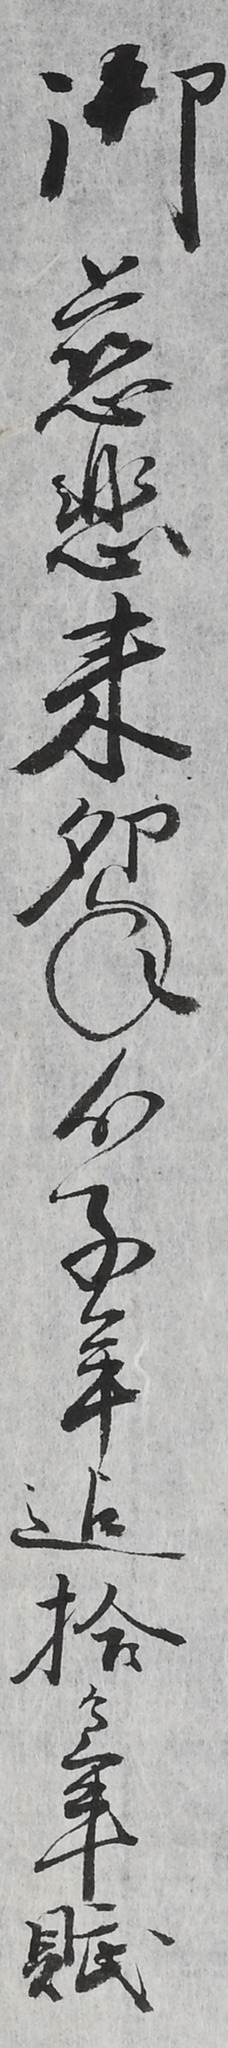御慈悲来卯年ゟ子年迄拾ヶ年賦
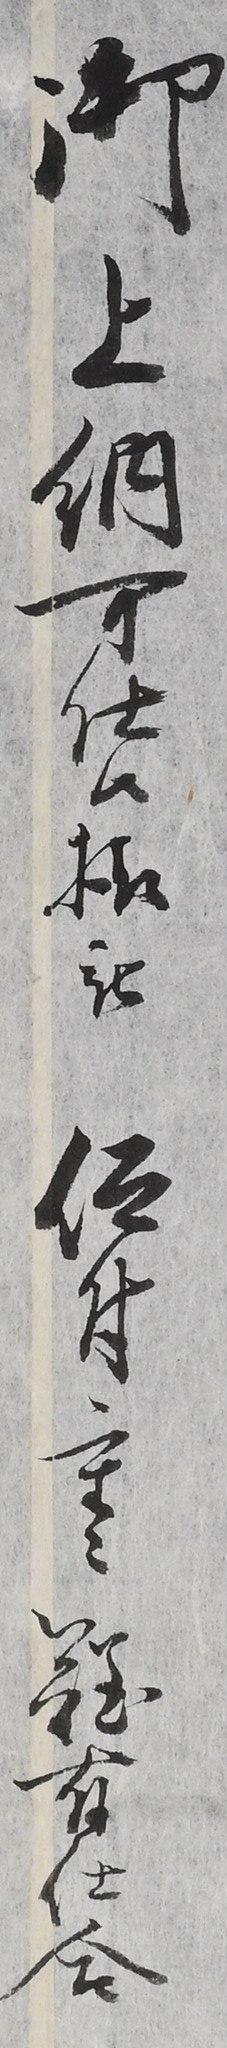御上納可仕候様被仰付重々難有仕合
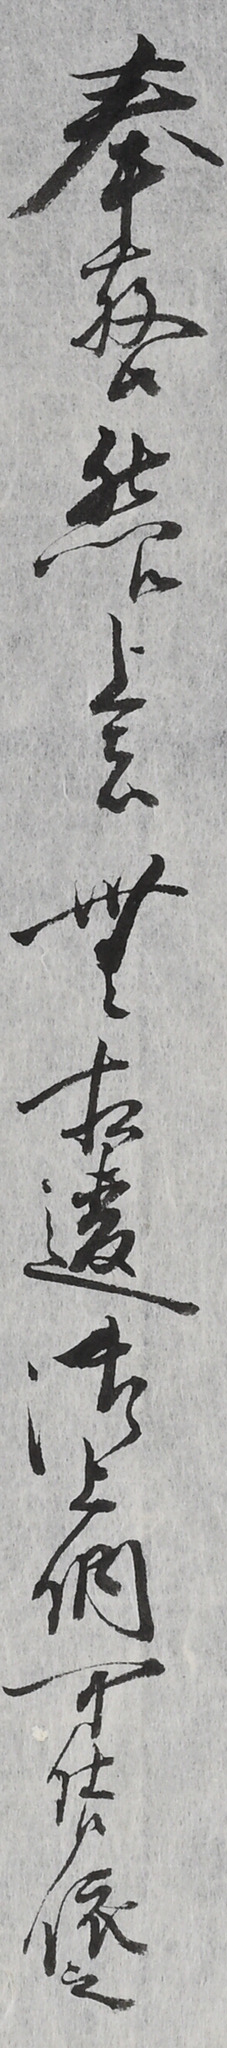奉存候然ル上者無相違御上納可仕候依之
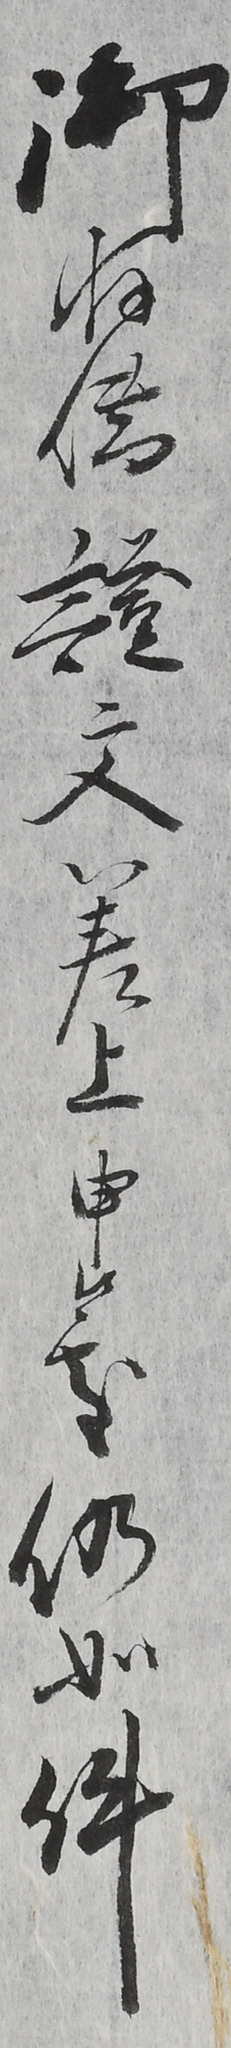御拝借証文差上申候処仍如件
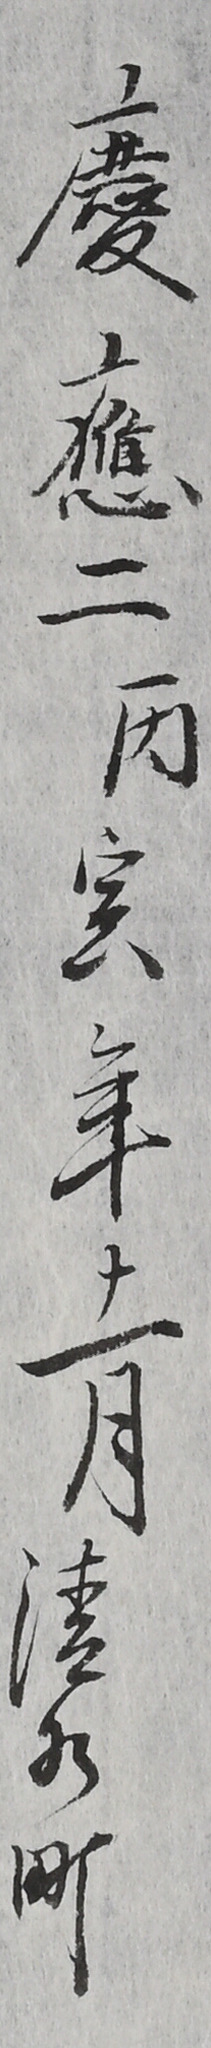慶応二丙寅年十一月清水町
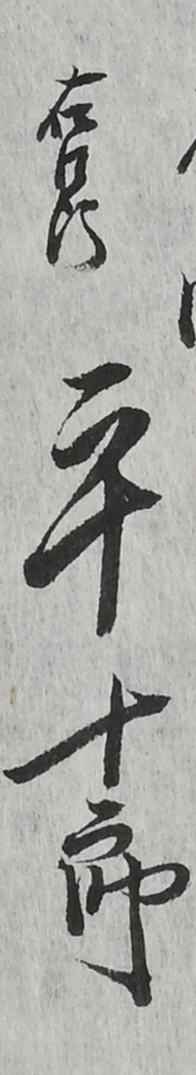右同断平十郎
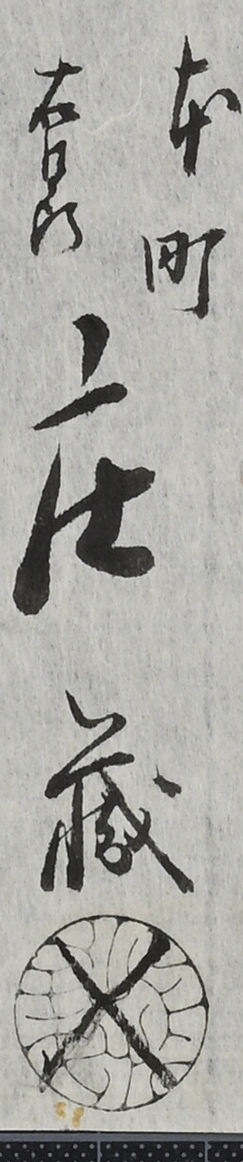右同断庄蔵
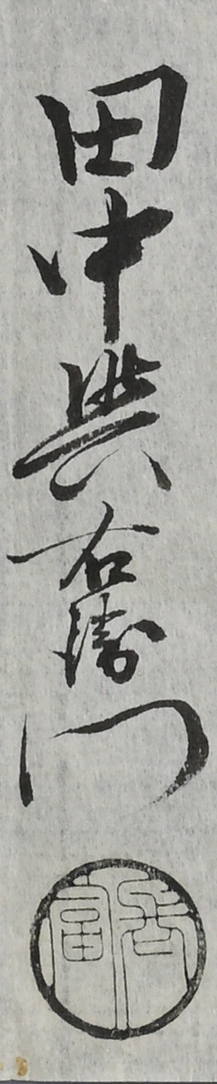田中与右衛門㊞
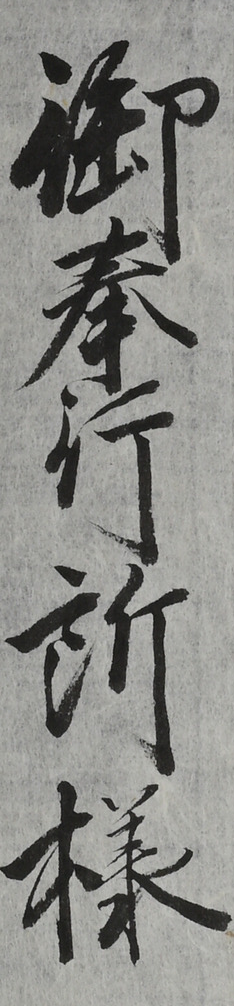御奉行所様

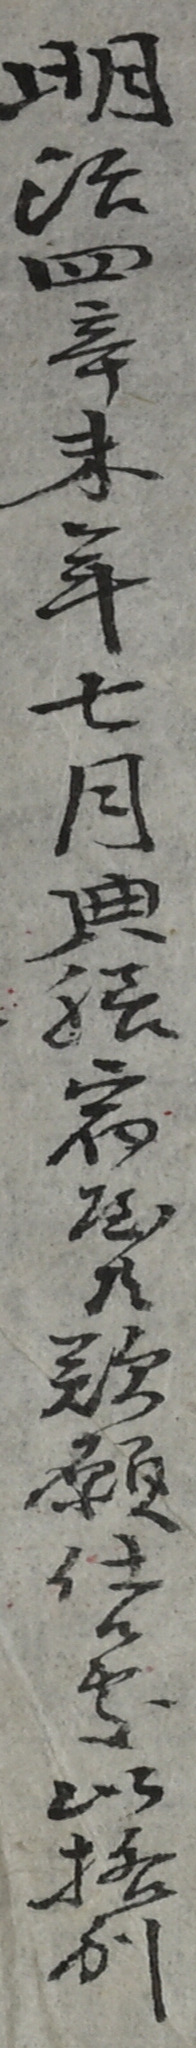明治四辛未年七月典膳宿屋共歎願仕候処以格別
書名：年賦御拝借証文
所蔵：伊那市立高遠町図書館・合同会社AMANE
